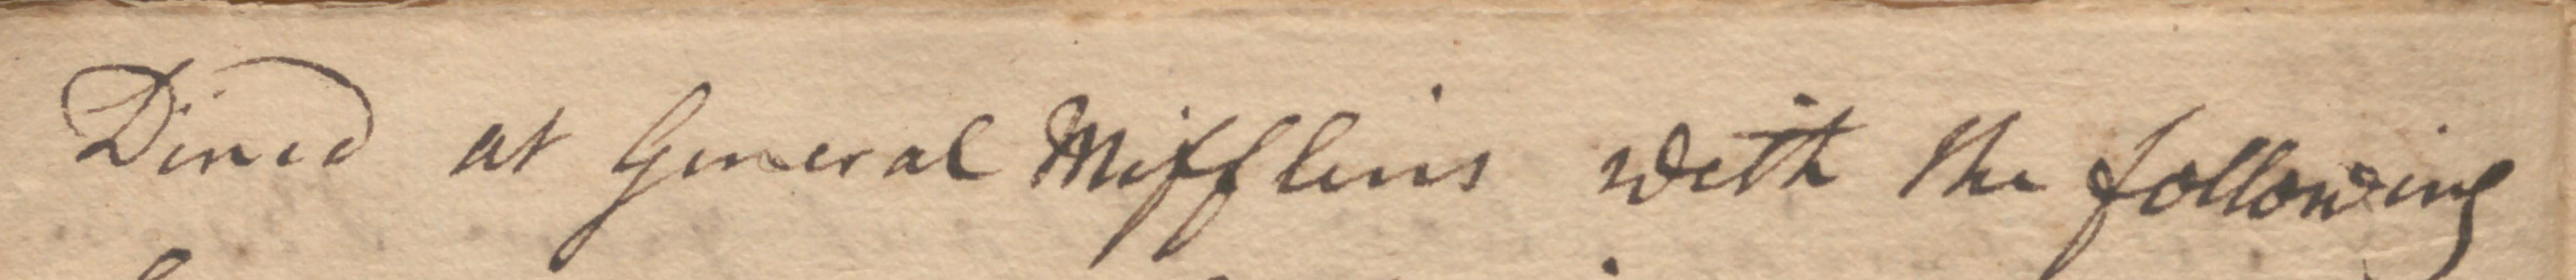Dined at General Mifflins with the following
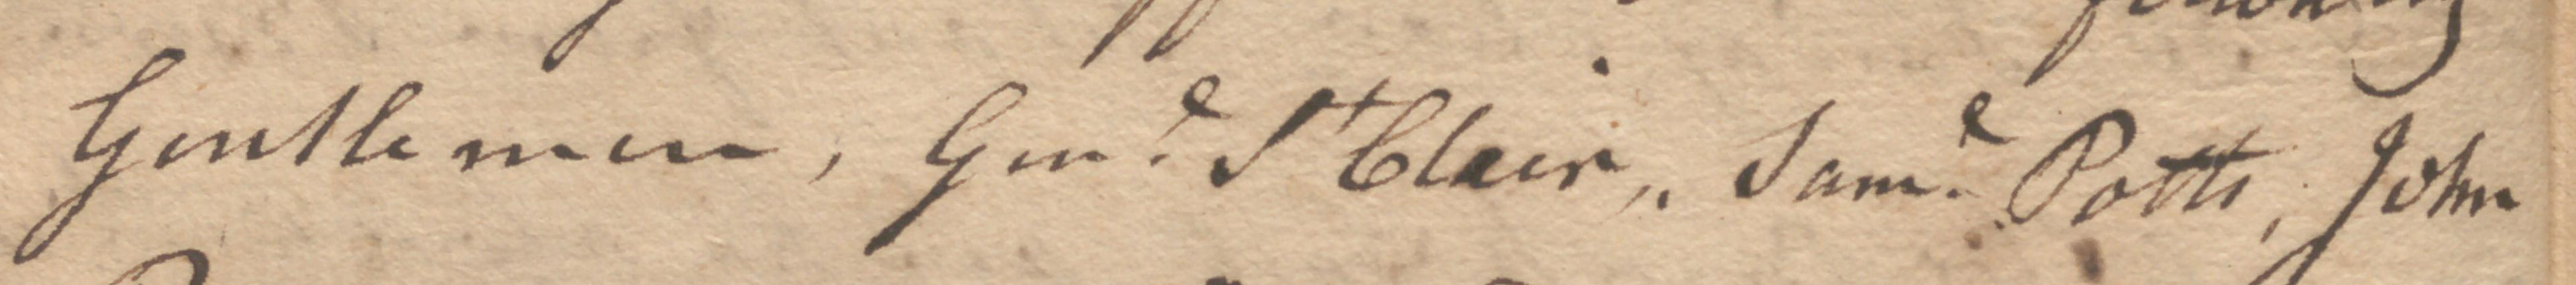Gentlemen, Gen^l. S^t Clair, Sam^l. Potts, John
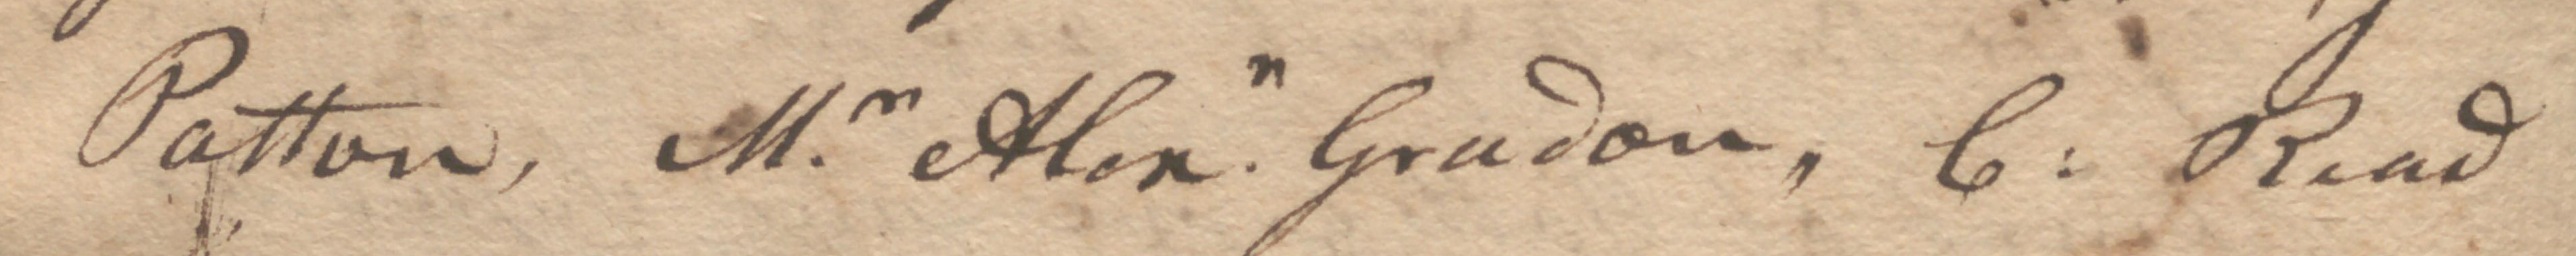Patton, M^r. Alex^r. Gradon, C. Read
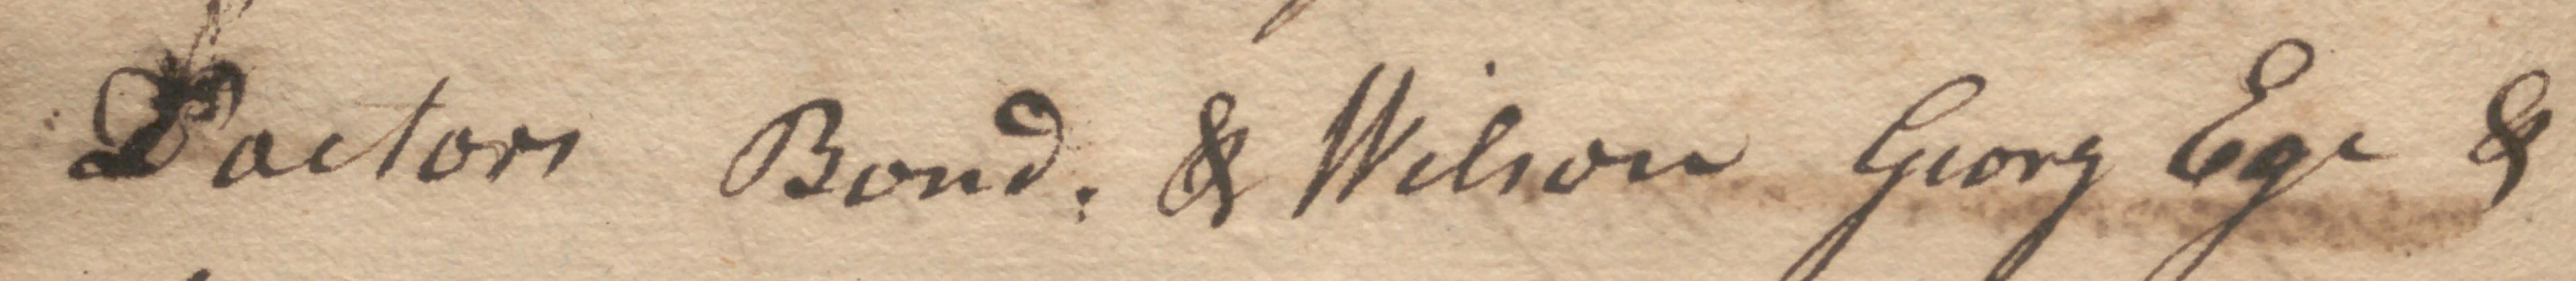Doctors Bond. & Wilson Georg Ege &
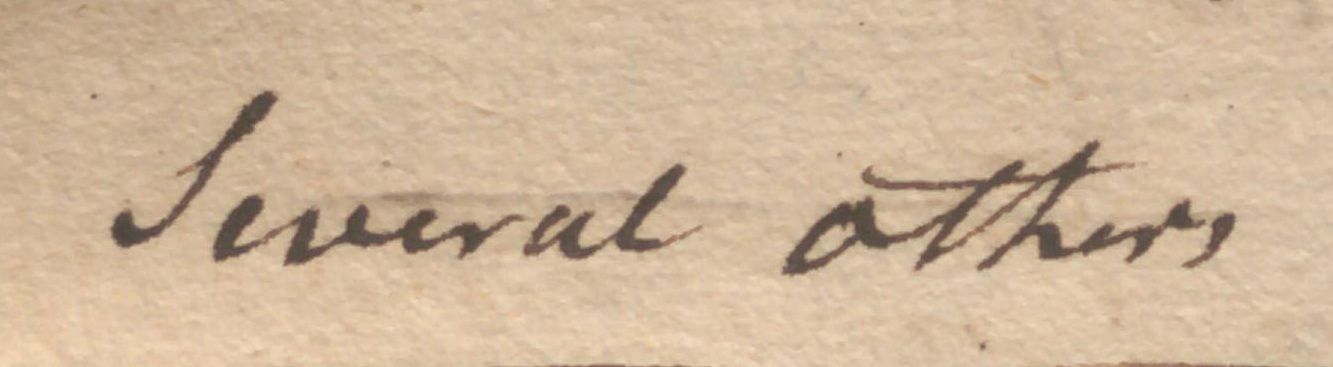several others
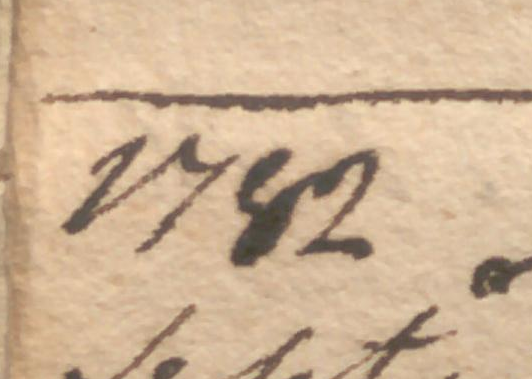1782
